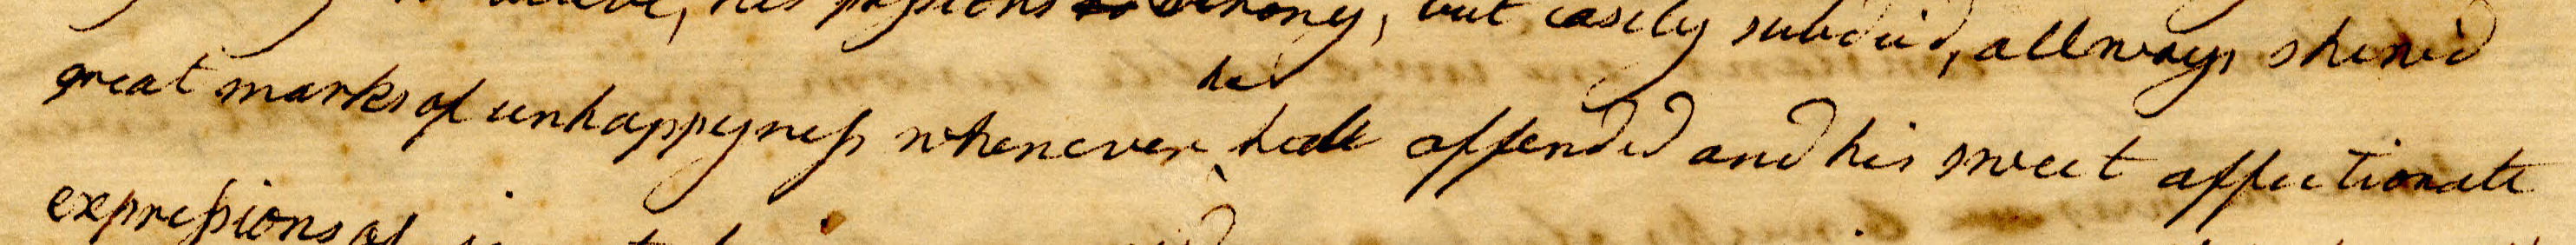great marks of unhappyness whenever ^ had offended and his sweet affectionate
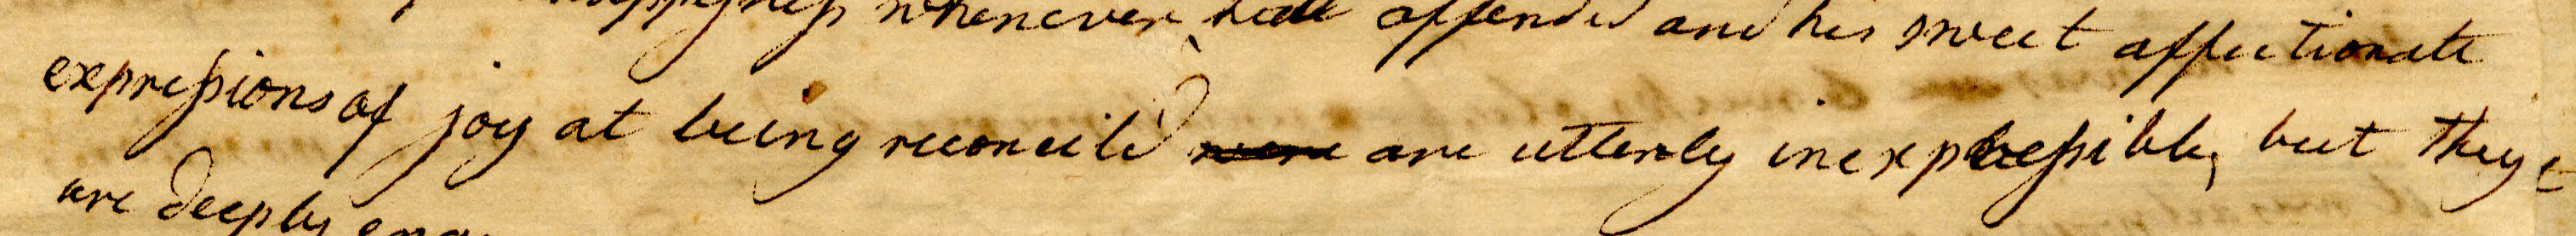expressions of joy at being reconcil'd [were] are utterly unexpressible, but they
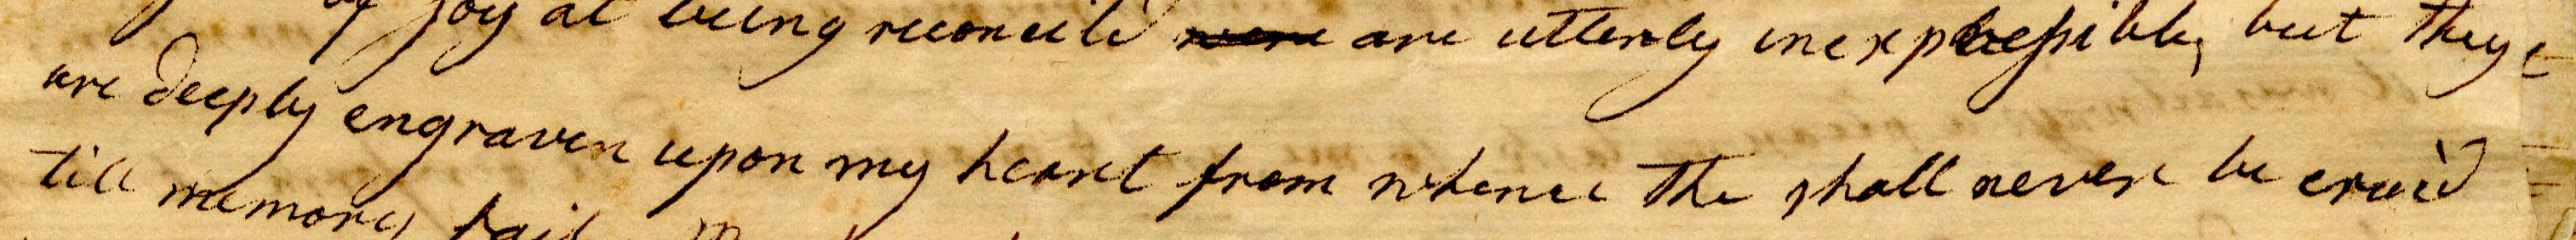are deeply engraven upon my heart from whence the shall never be eras'd
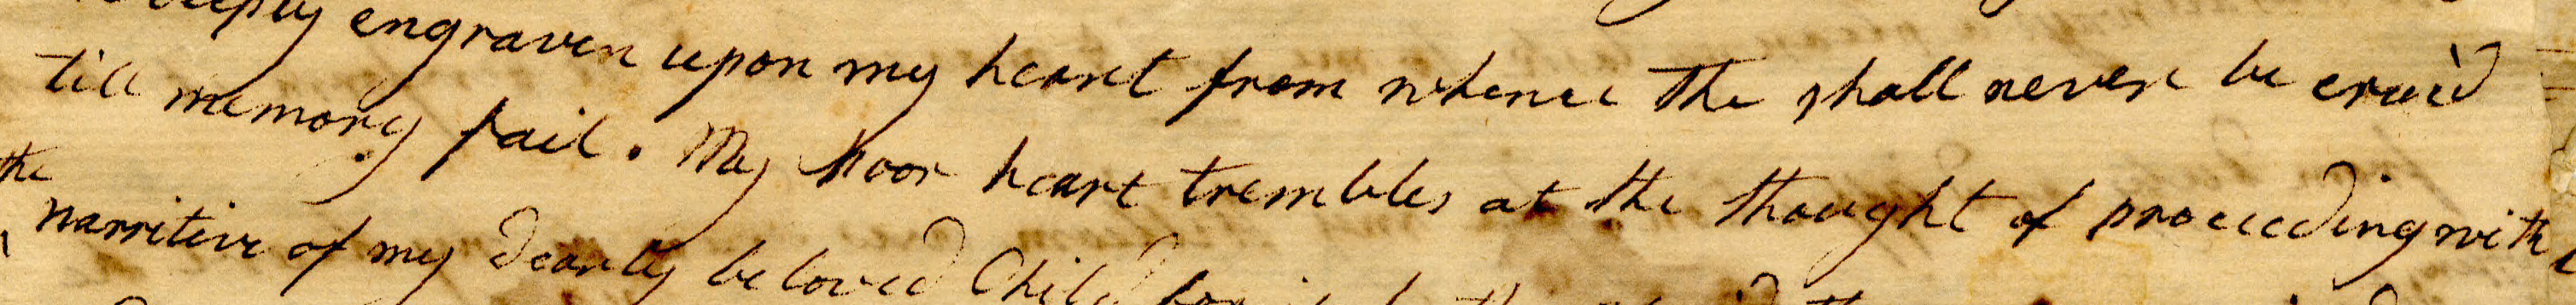till memory fail. My poor heart trembles at the thought of proceeding with
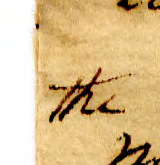the
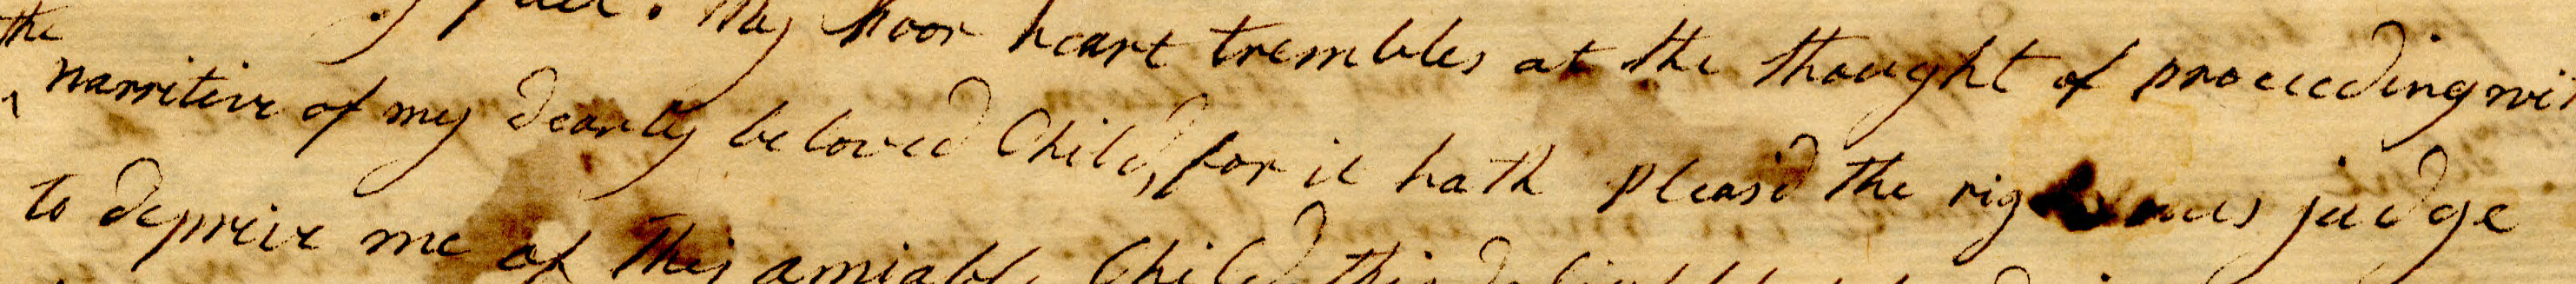^ narritive of my dearly beloved Child, for it hath pleas'd the righteous judge
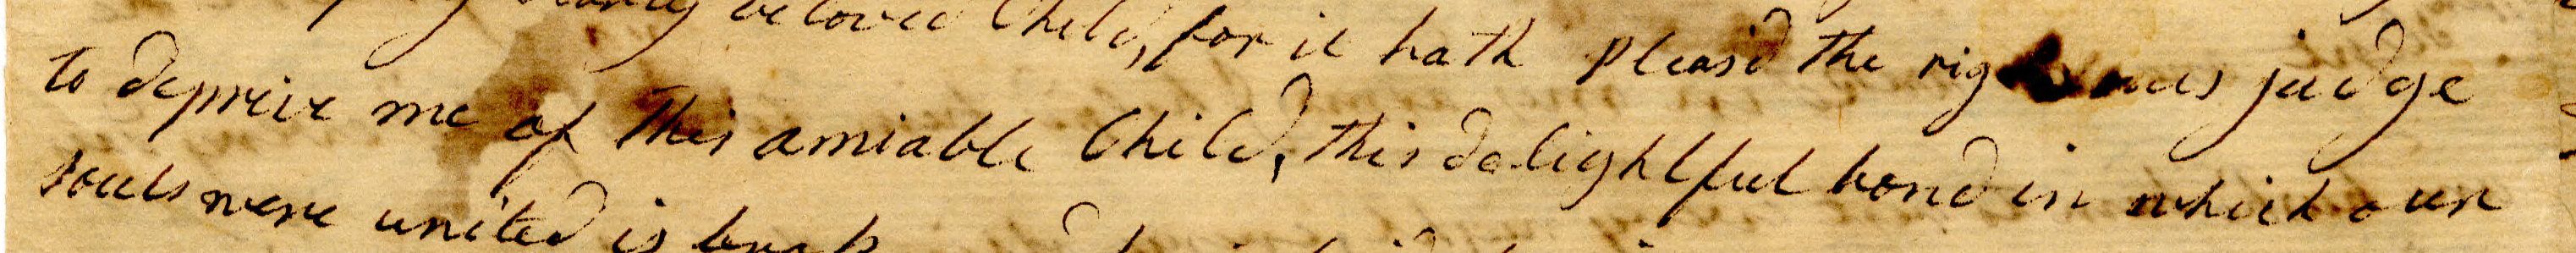to deprive me of the amiable Child, this delightful bond in which our
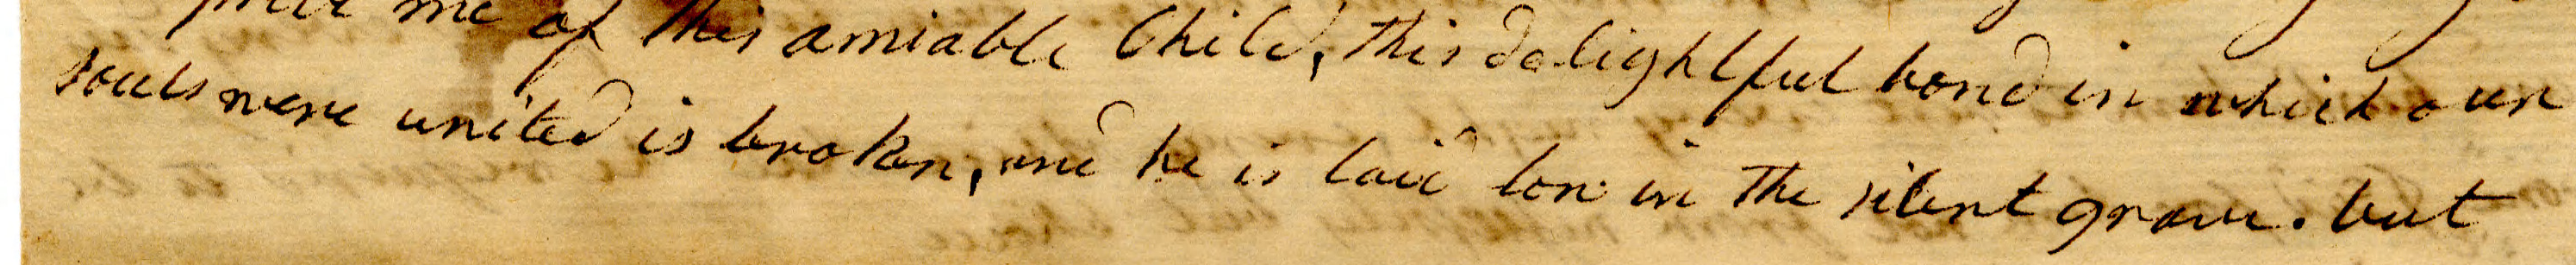souls were united is broken, and he is laid low in the silent grave. but
